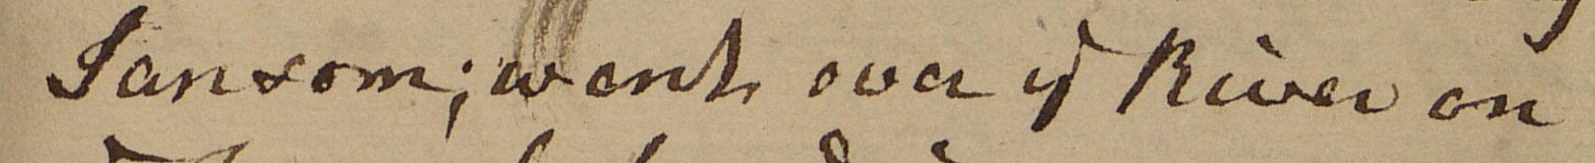Sansom; went over y^e River on
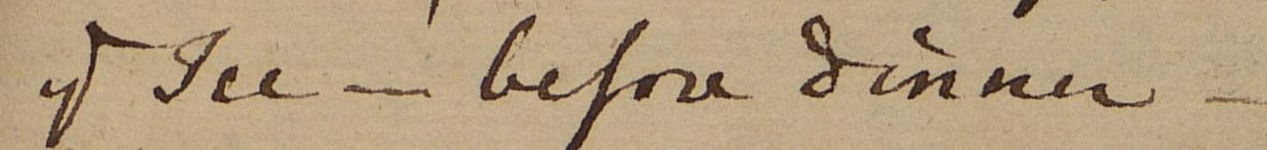y^e Tee- before dinner-
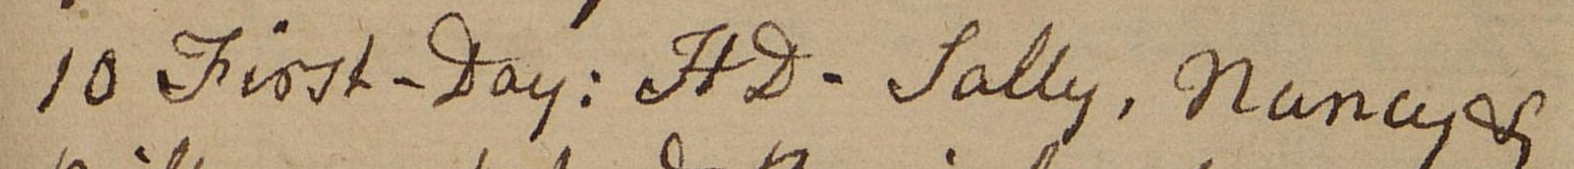10 First- Day: HD- Sally, Nancy &
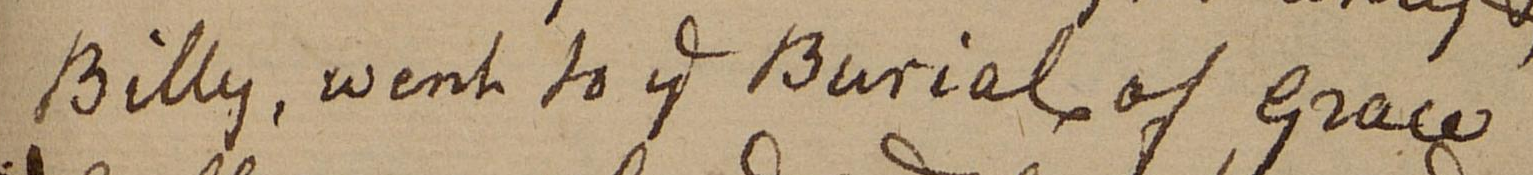Billy, went to y^e Burial of Grace
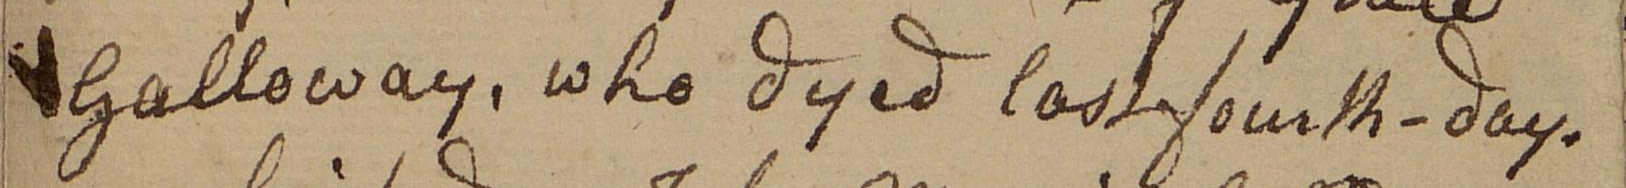Galloway, who dyed last fourth- day.
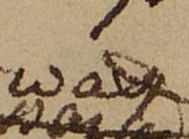was
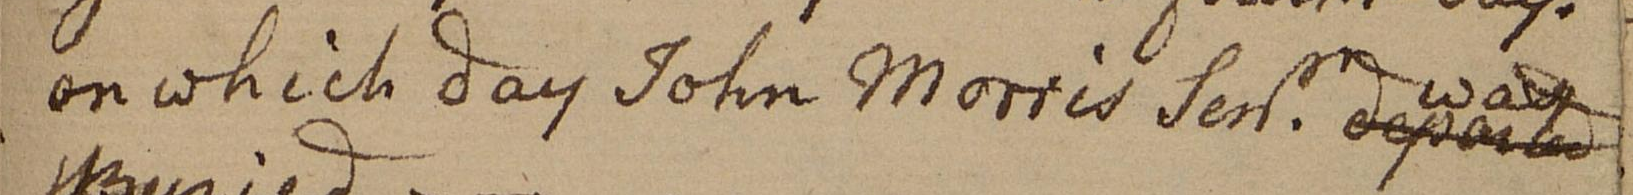on which day John Morris Sen^r. departed
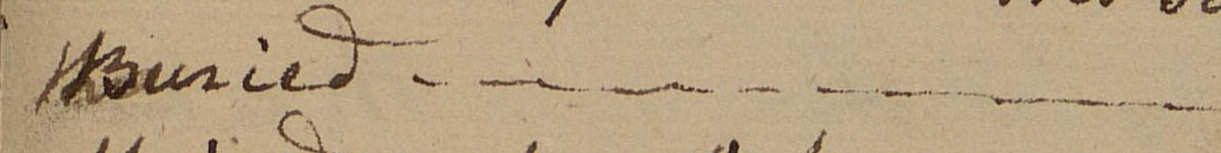Buried--.-- - ----
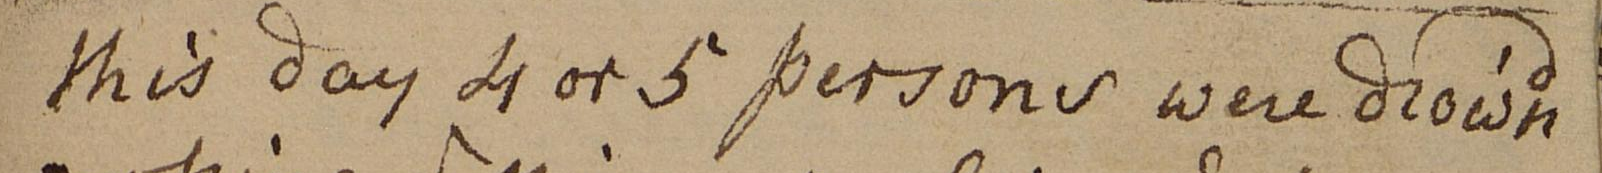this day 4 or 5 persons were drown'd
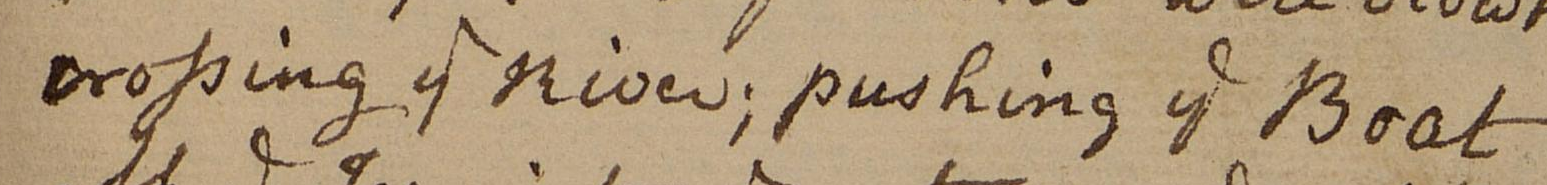crossing y^e River; pushing y^e Boat
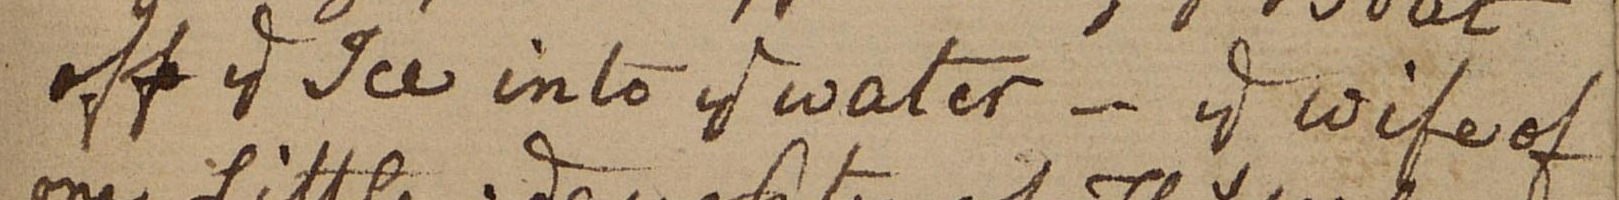off y^e Ice into y^e water- y^e wife of
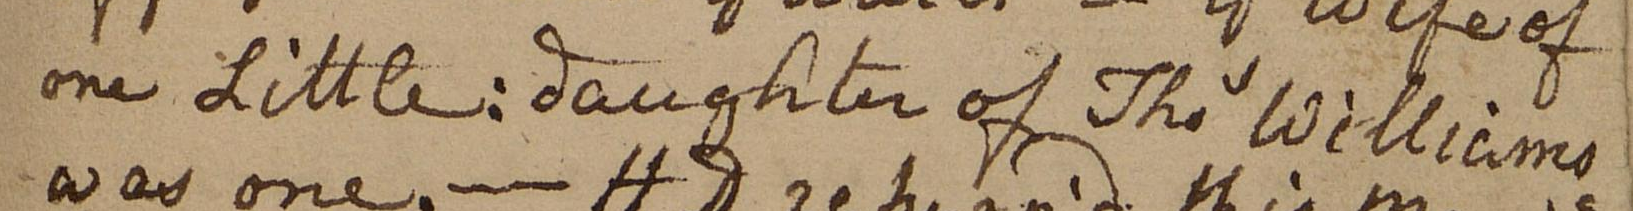one Little: daughter of Tho^s Williams
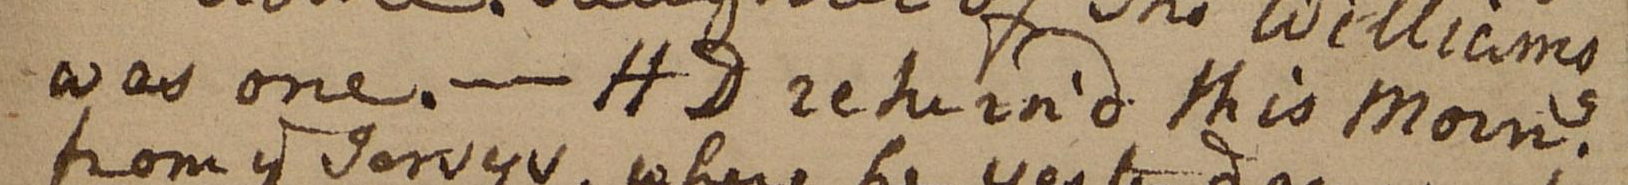was one.- HD return'd this morn^g.
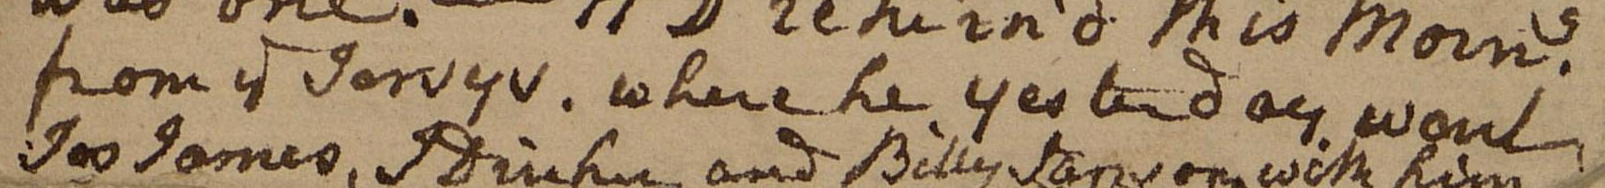from y^e Jersys. where he yesterday wont
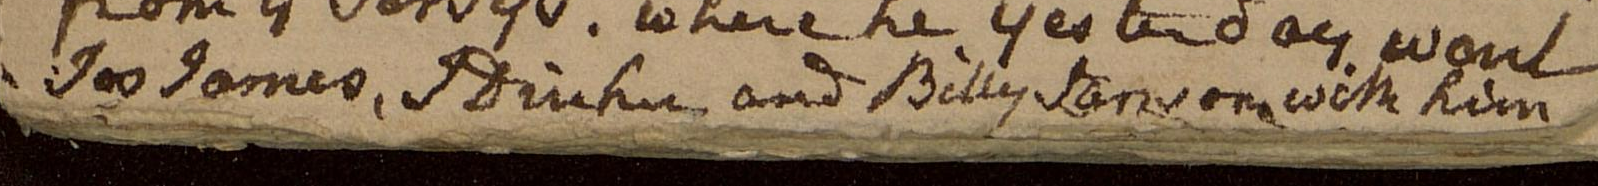Jos James, J Drinker, and Billy Sansom with him
